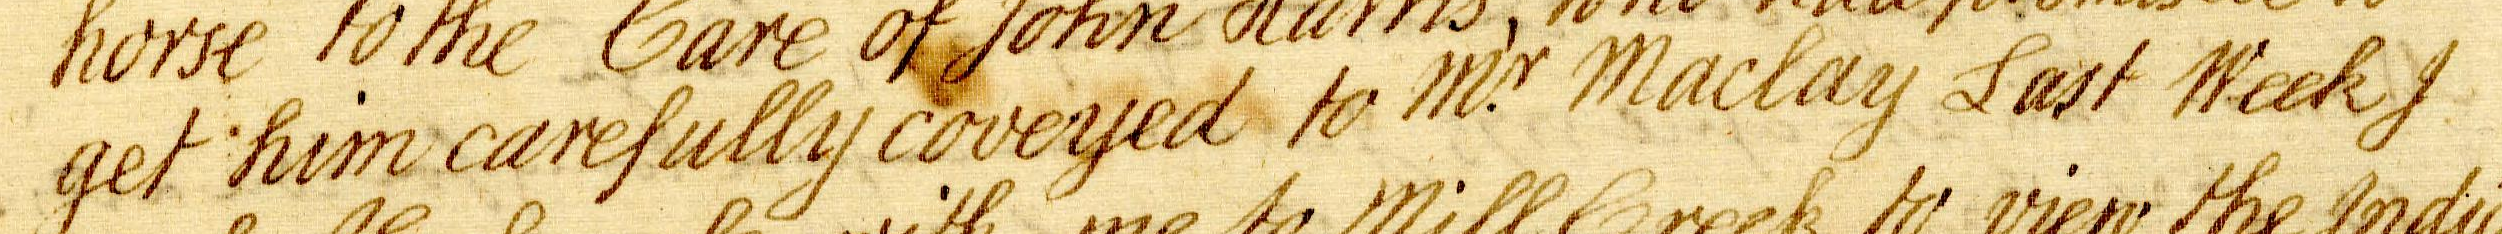get him carefully coveyed to M^r. Maclay Last Week I
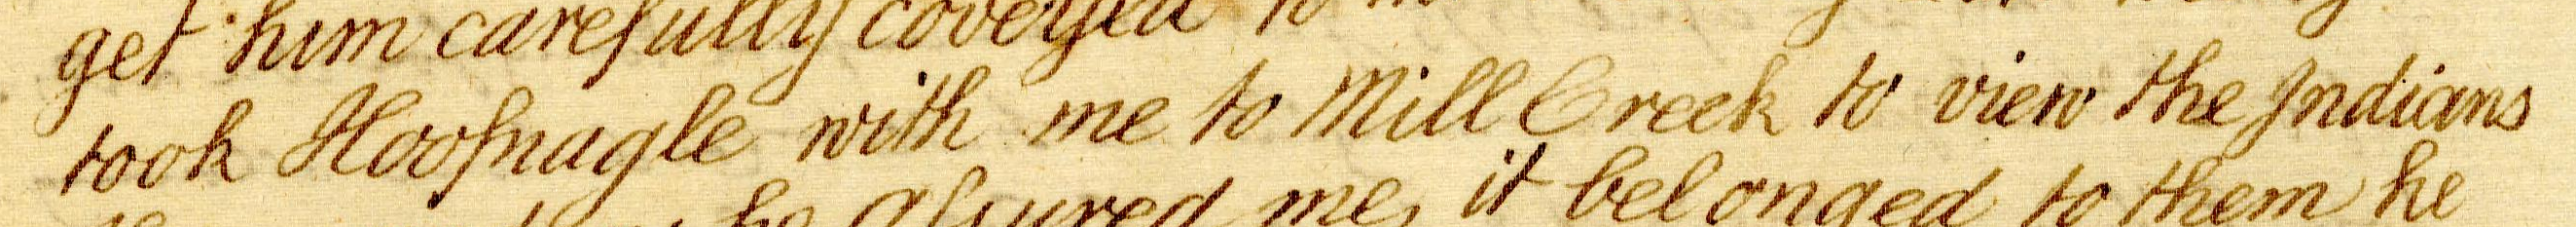took Hoofnagle with me to Mill Creek to view the Indians
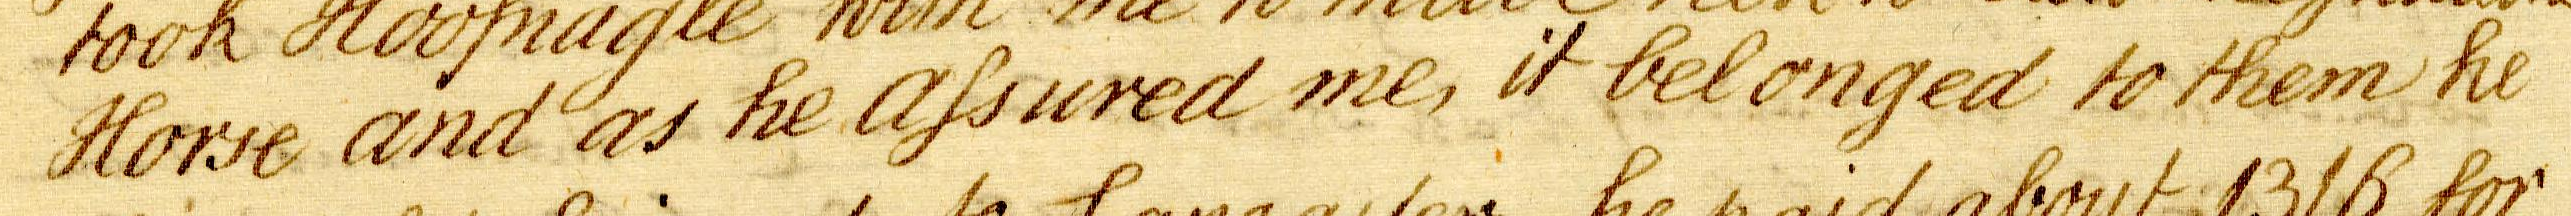Horse and as he Assured me, it belonged to them he
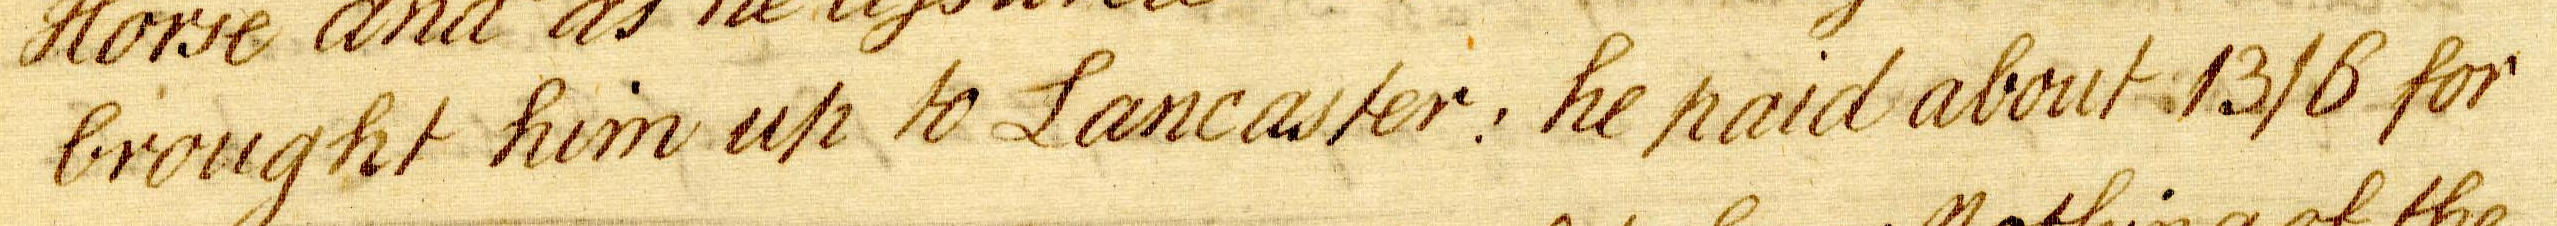brought him up to Lancaster; he paid about 13s6 for
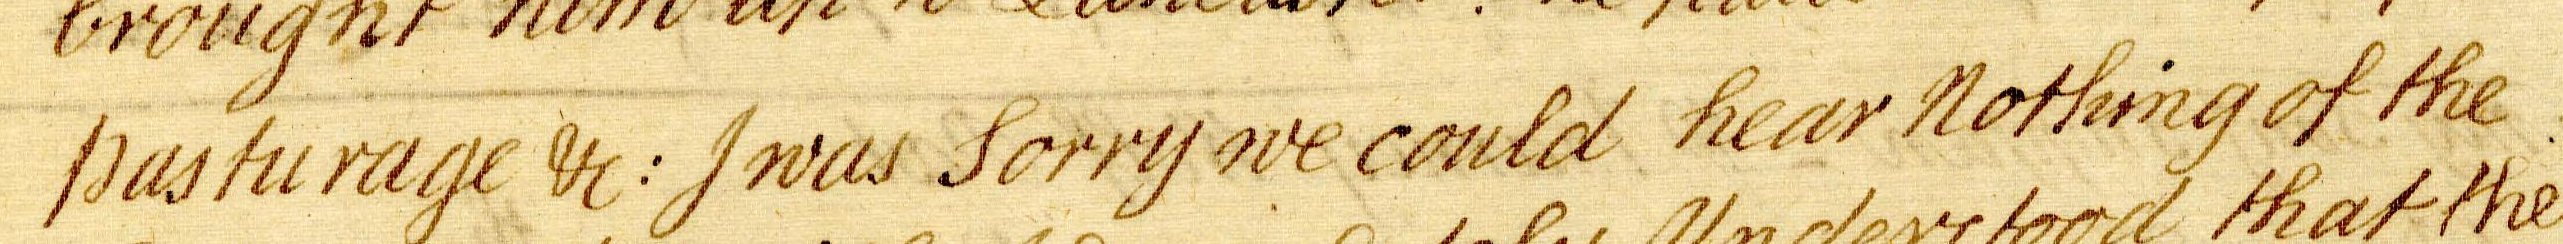pasturage &c: I was Sorry we could hear Nothing of the
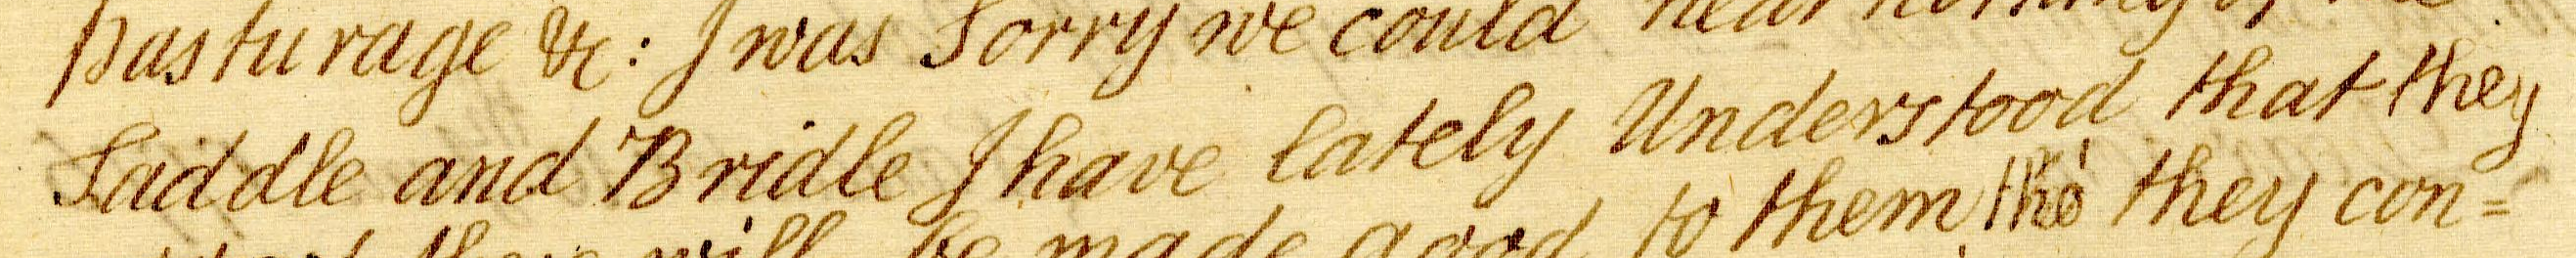Saddle and Bridle I have lately Understood that they
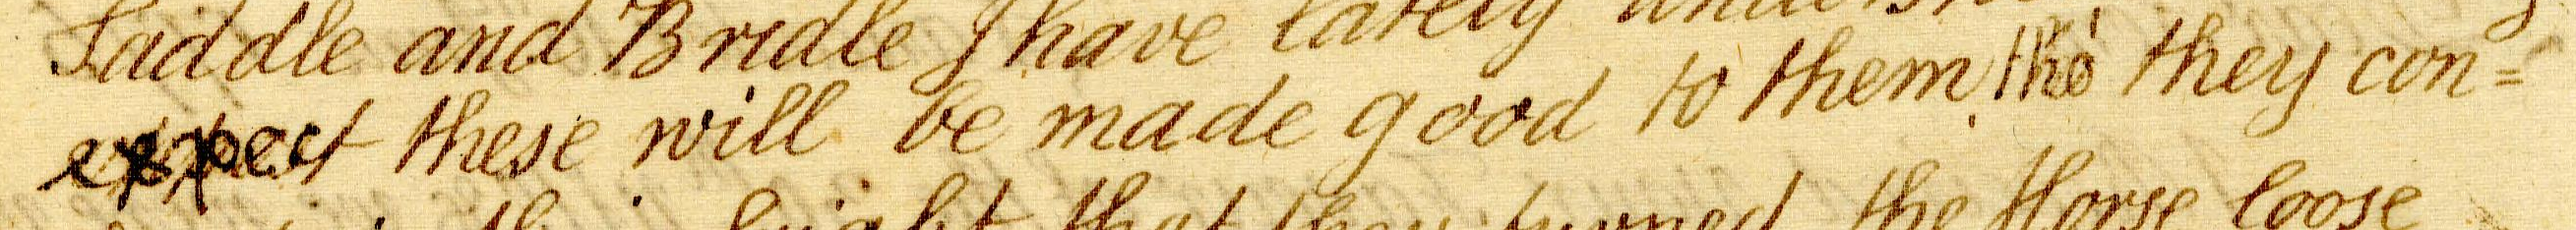[expect] these will be made good to them tho' they con-
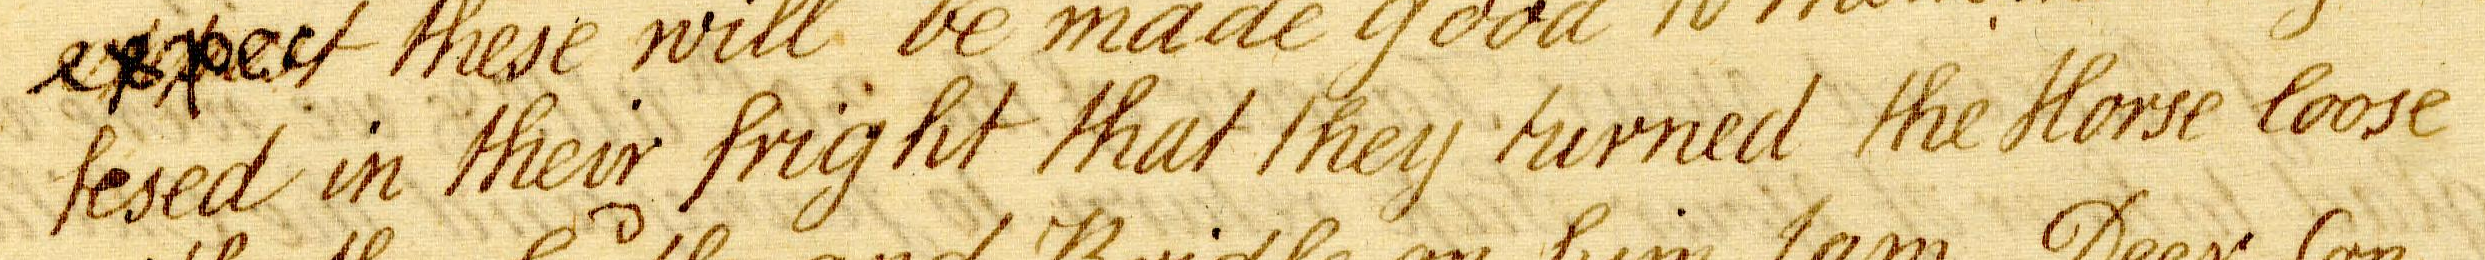fesed in their fright that they turned the Horse loose
